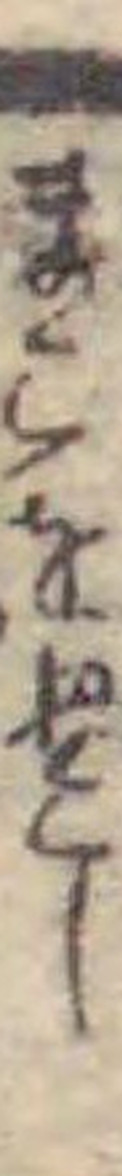まこをおこし
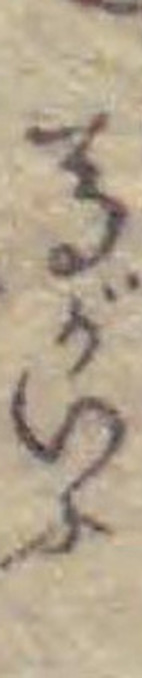馬がいふ
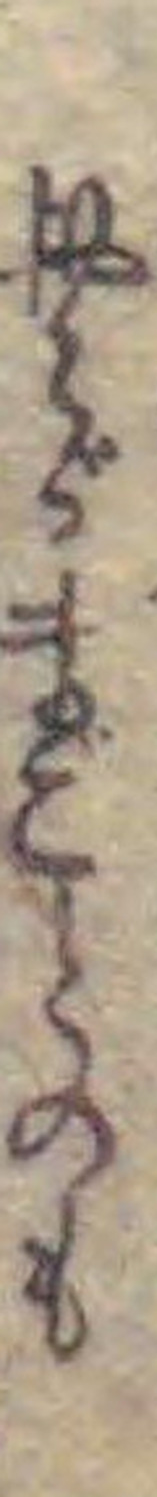おらがまごとのも
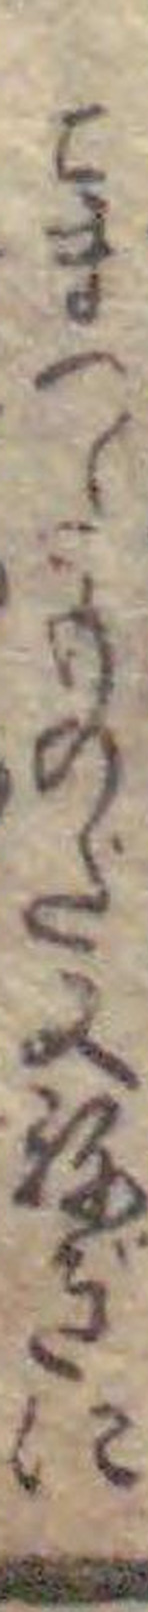こまつたものだ又ねぎに
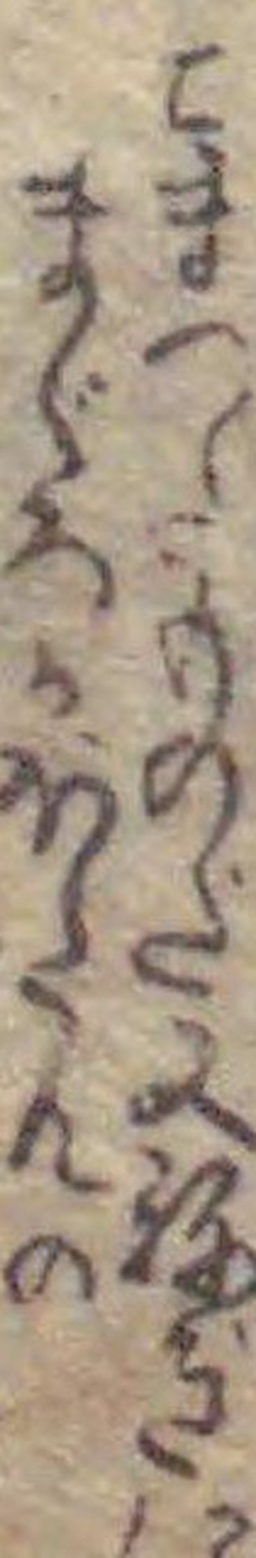まぐろかほたんの
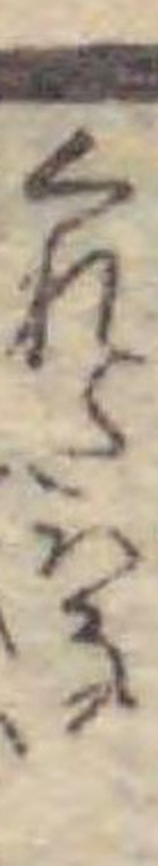くれたはな
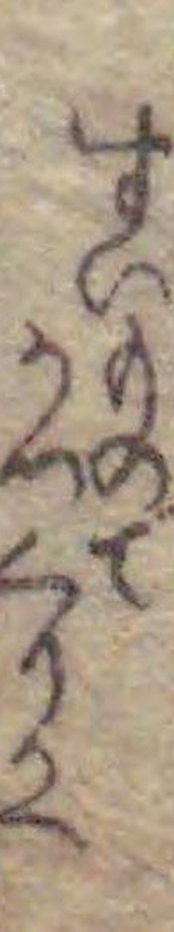すいもので
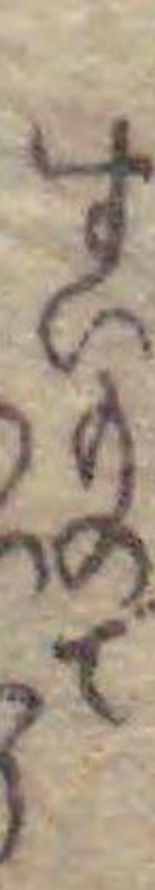すいもので
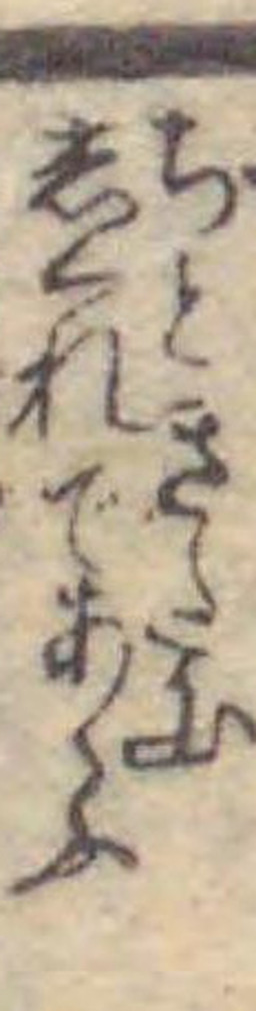しくれであらふ
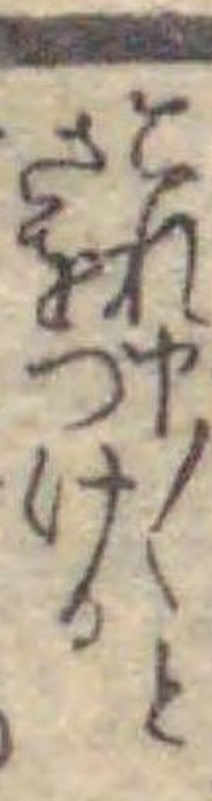さをつける
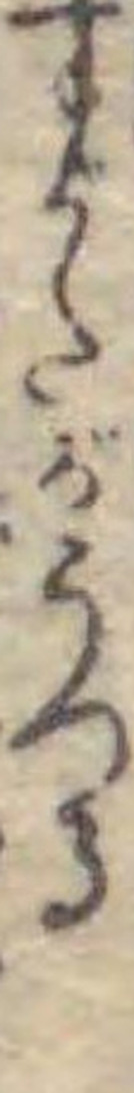すかたがうつる
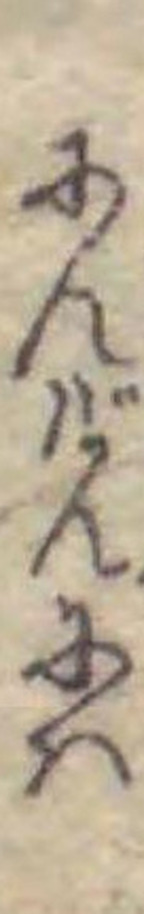にんげんには
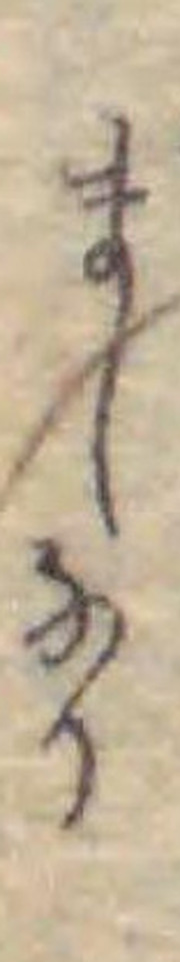ましなり

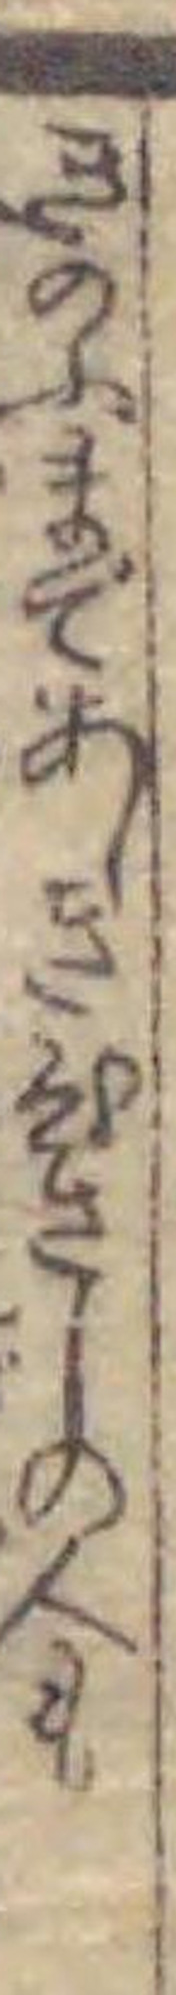きのふまであしき心さしの人も
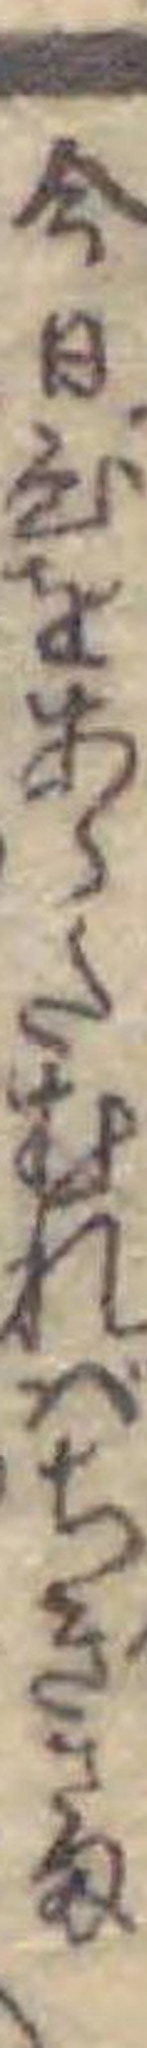今日は心をあらたむればちきさま
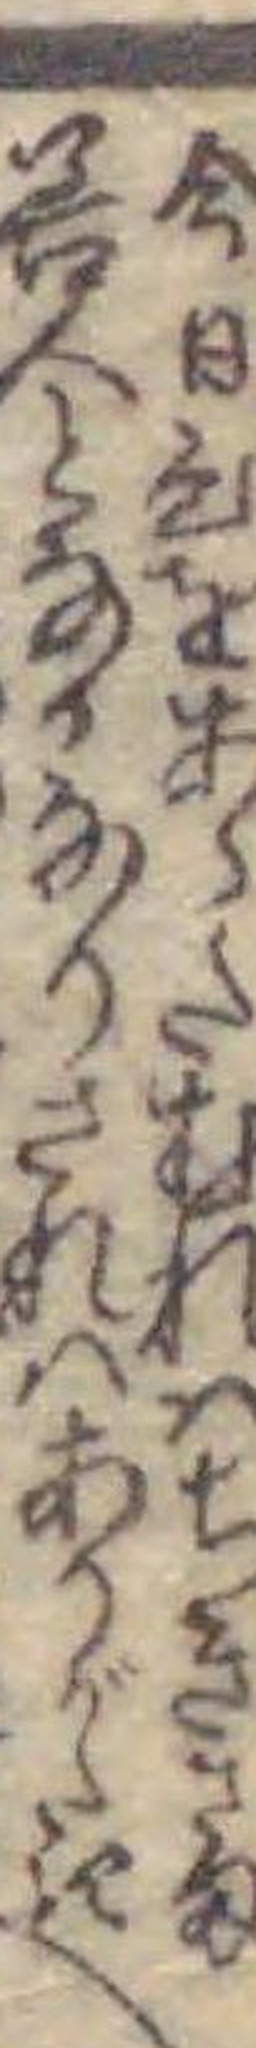善人となるなりされはありがたき
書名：人心鏡写絵 : 3巻
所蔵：国立国会図書館 National Diet Library, JAPAN
